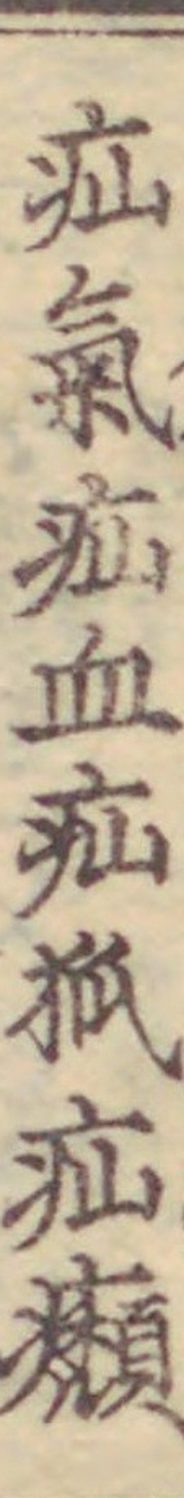疝気疝血疝狐疝㿗
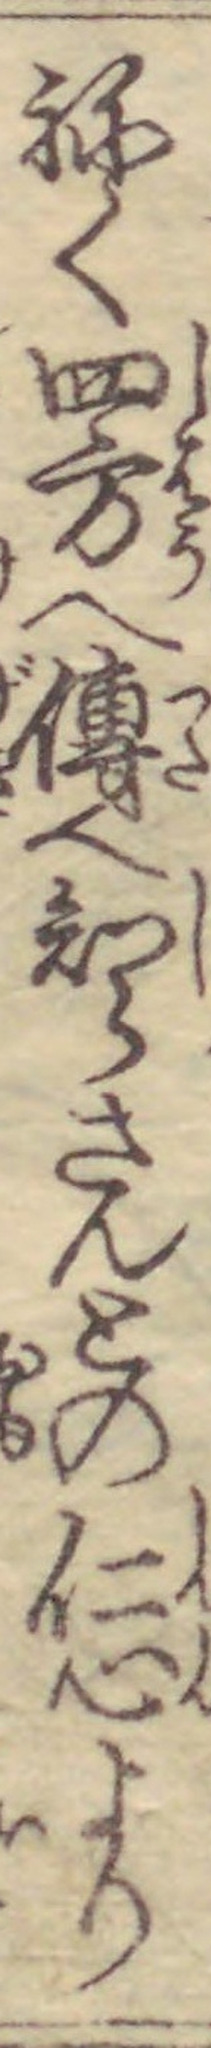ねく四方へ伝へ知らさんとの仁心より
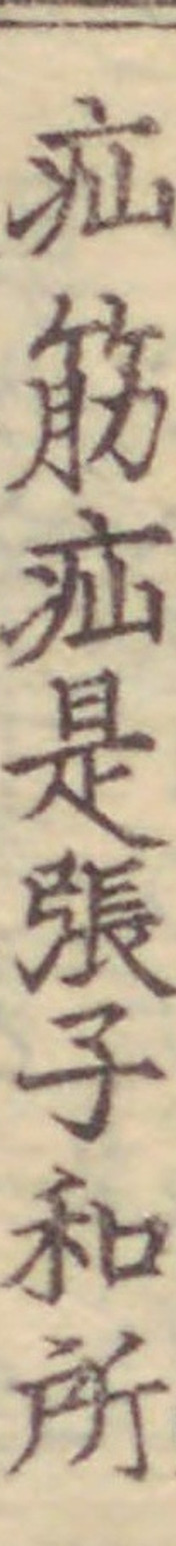疝筋疝是張子和所
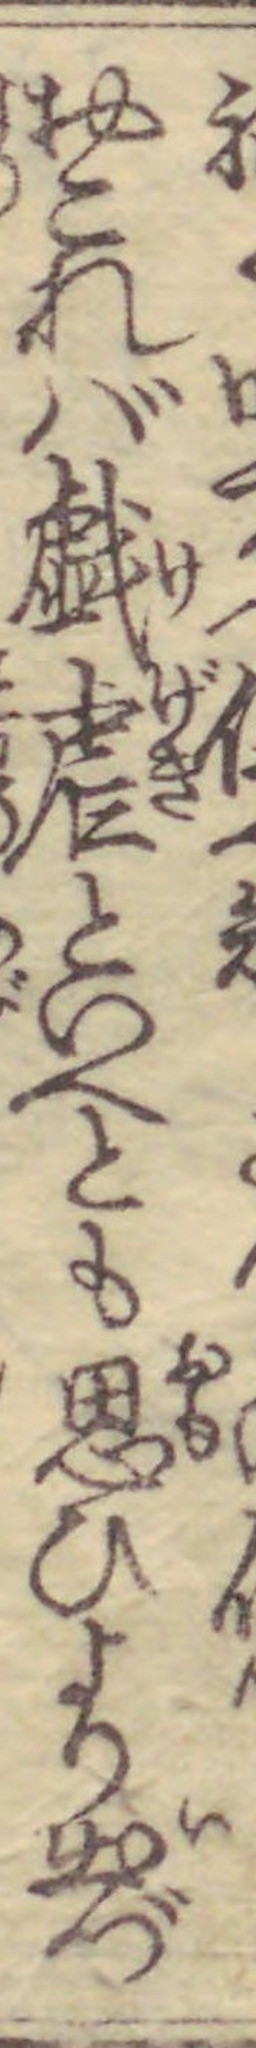おこれば戯虐といへとも思ひより出づ
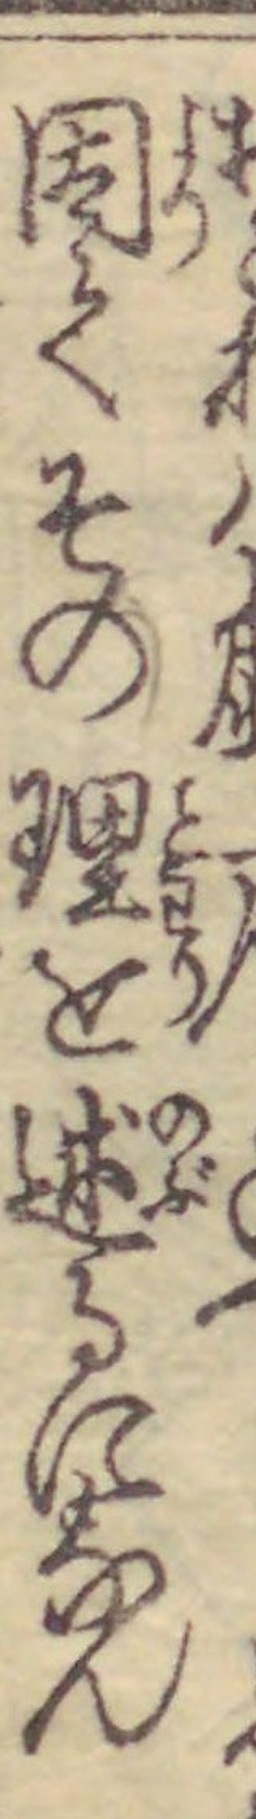因てその理を述るになん
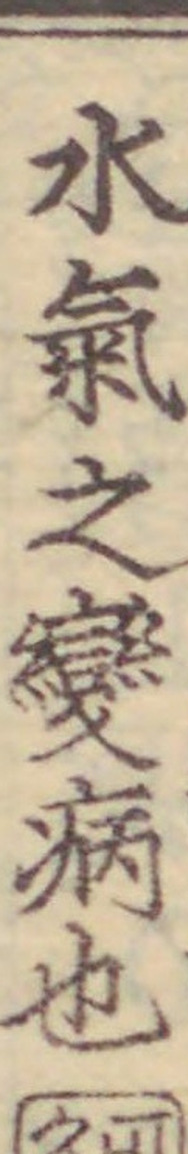水気之変病也
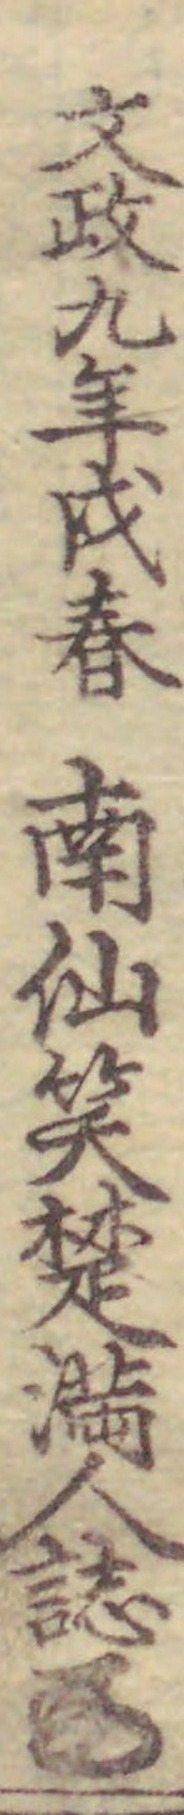文政九年戌春南仙笑楚満人誌

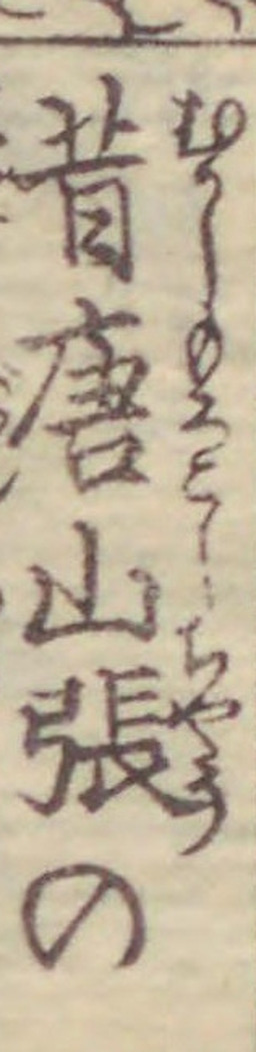昔唐山張の
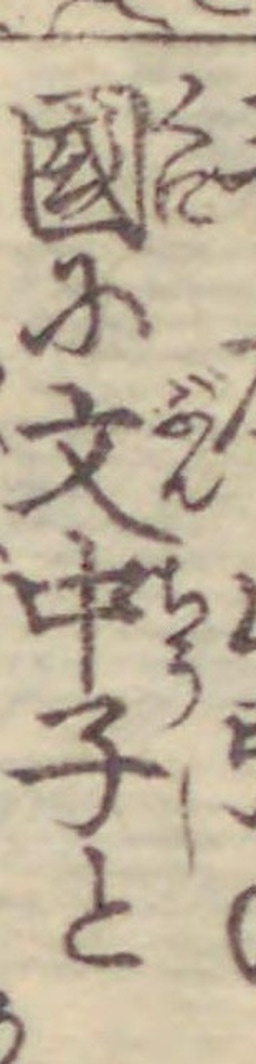国に文中子と
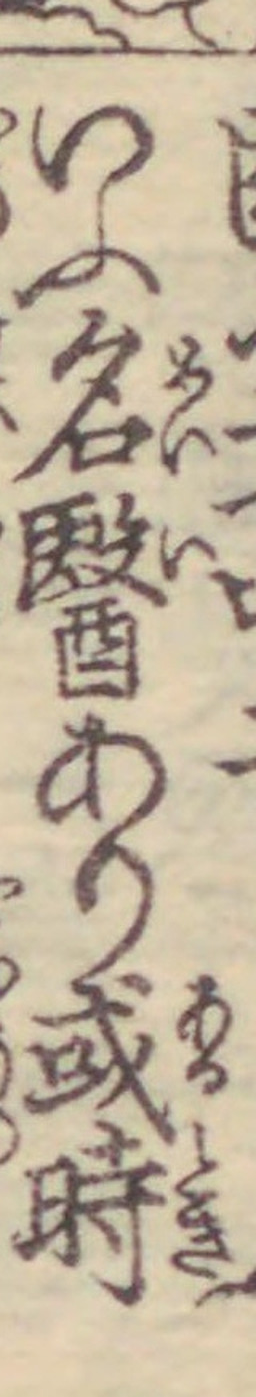いふ名医あり或時
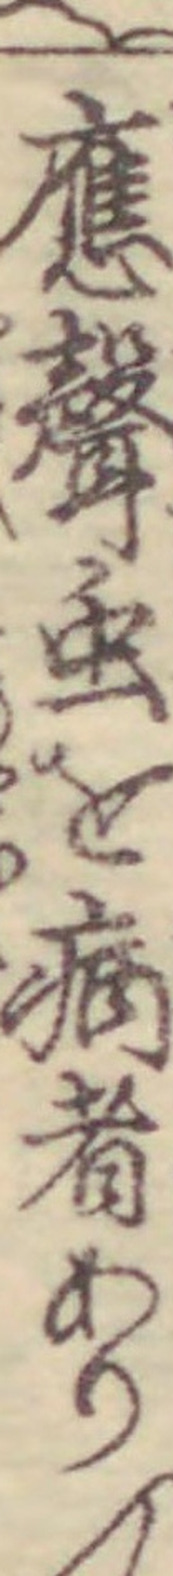応声虫を病者あり
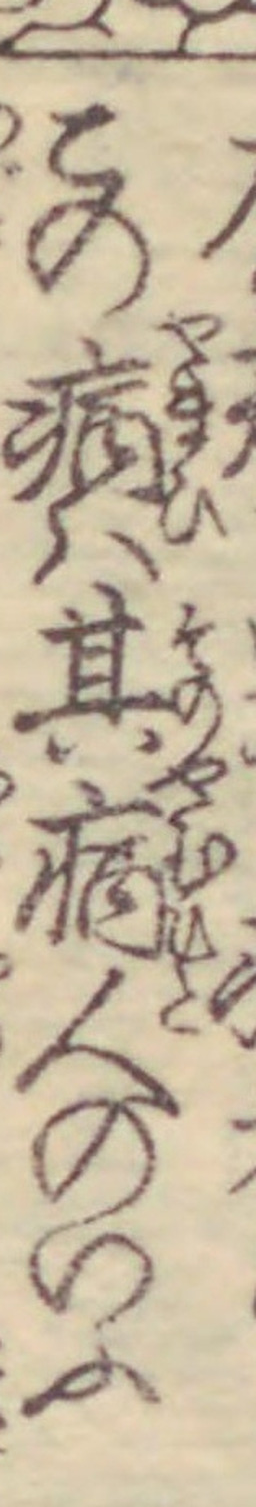この病は其病人のいふ
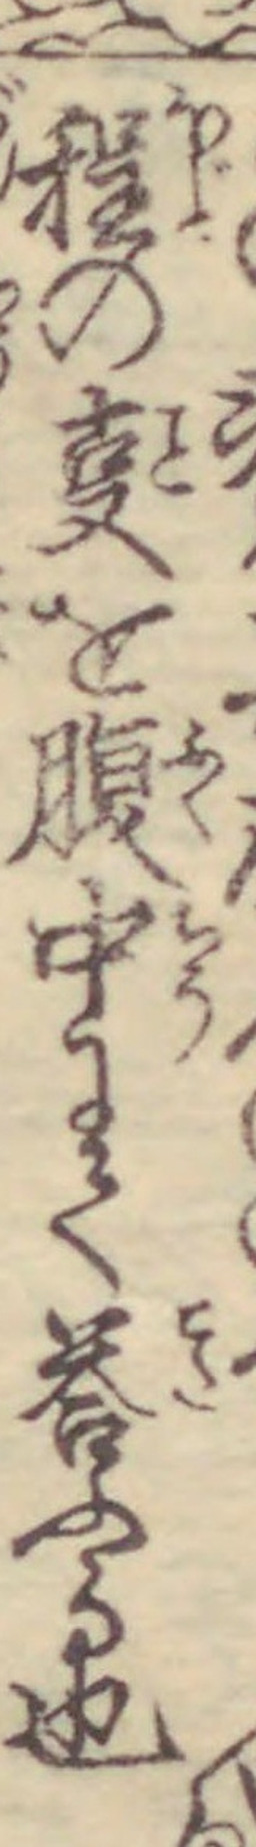程の事を腹中にて答ふる也
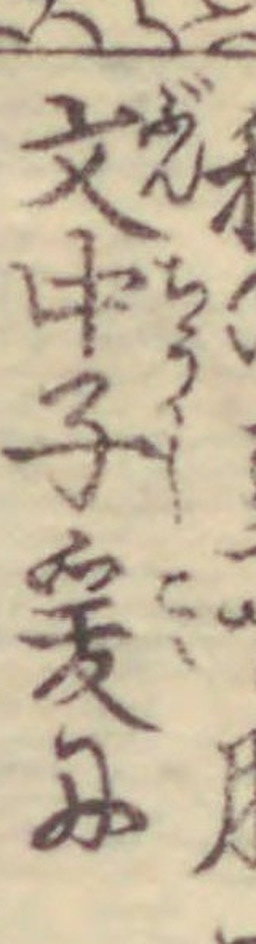文中子爰に
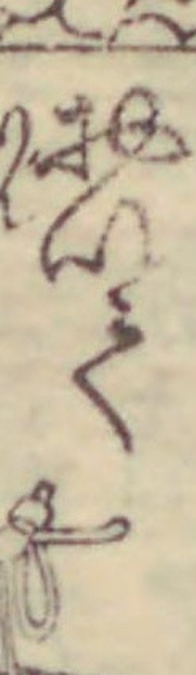おいて
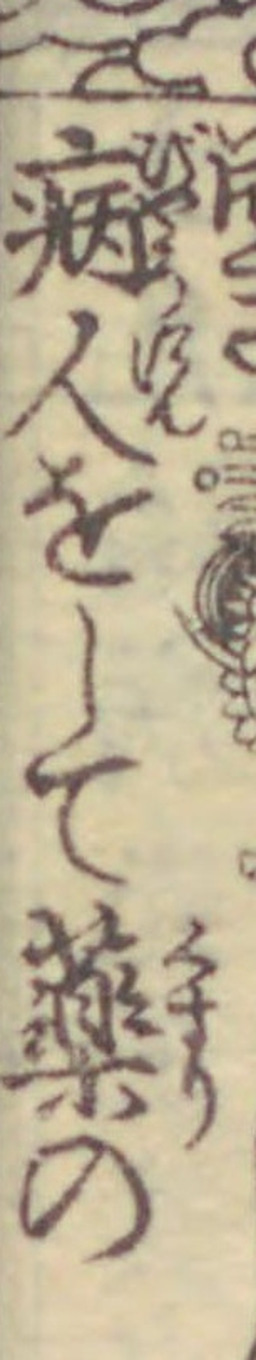病人をして薬の
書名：腹内窺機関 2巻
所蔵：国立国会図書館 National Diet Library, JAPAN
